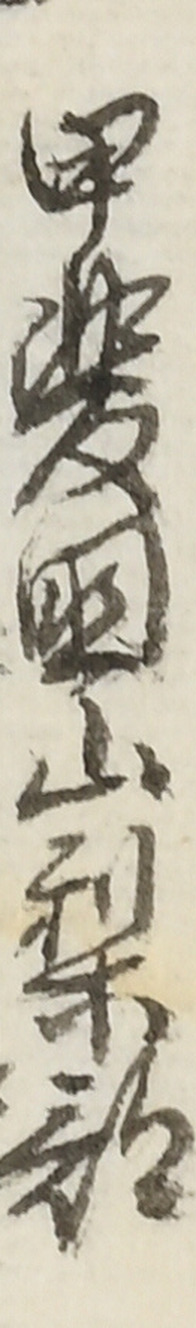一甲斐国山梨郡
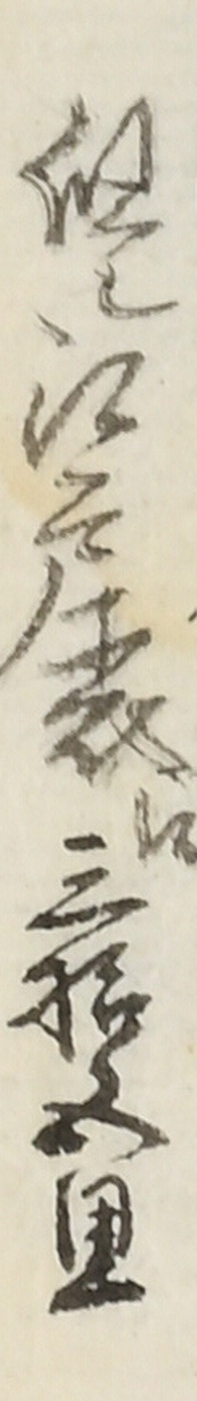但し江戸表え三拾五里

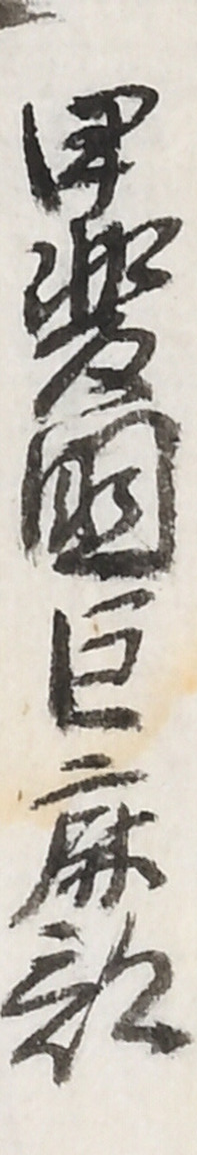甲斐国巨摩郡
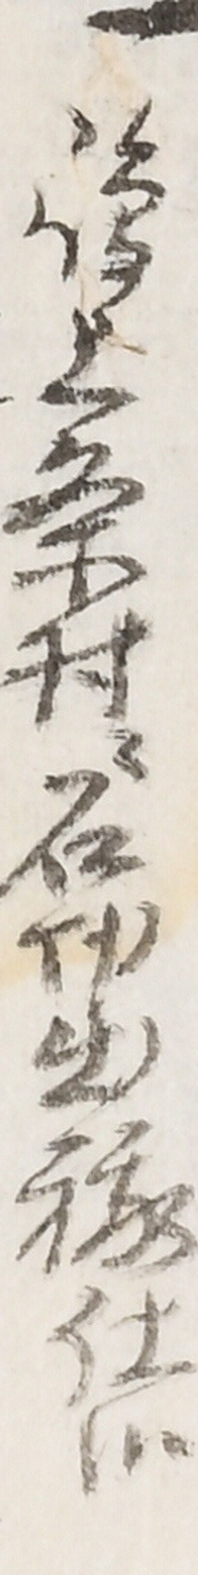一八幡村ニ石切出稼仕候
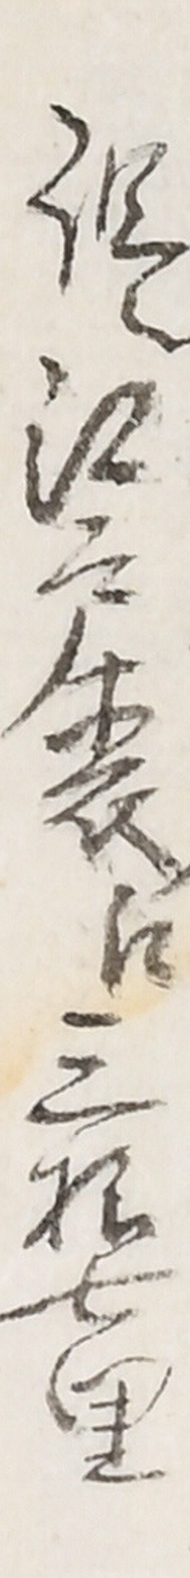但し江戸表え三拾七里
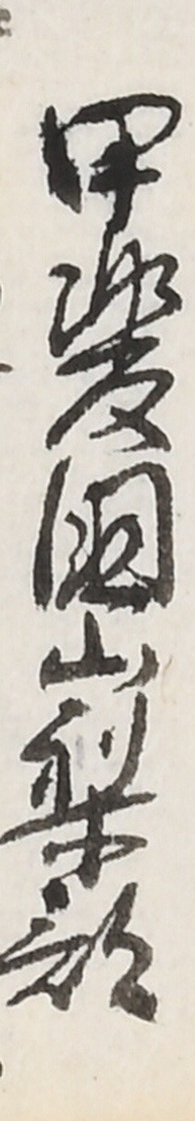甲斐国山梨郡
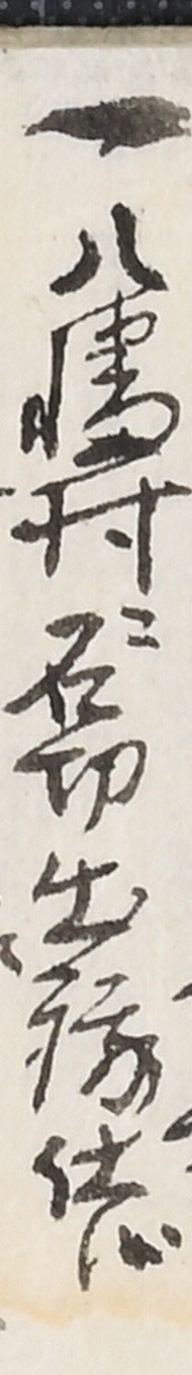一八幡村ニ石切出稼仕候
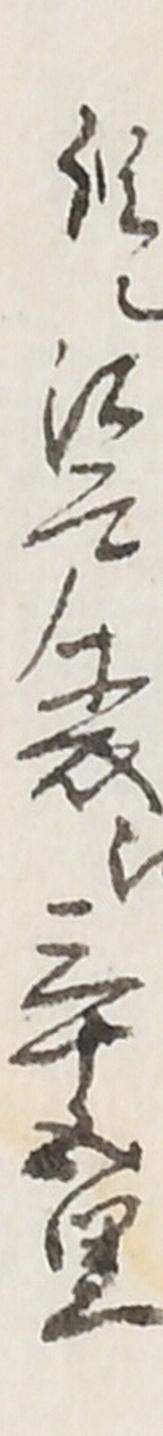但し江戸表え三十五里
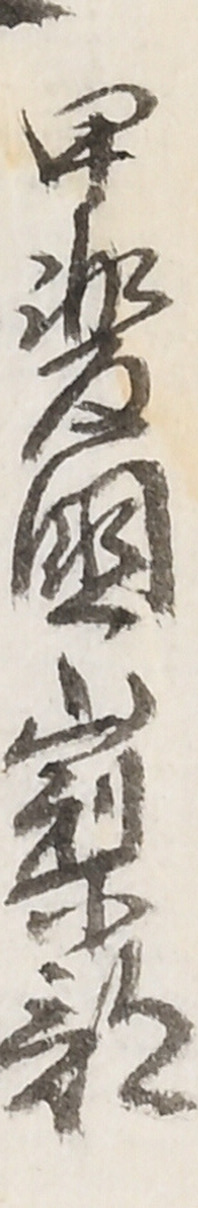甲斐国山梨郡
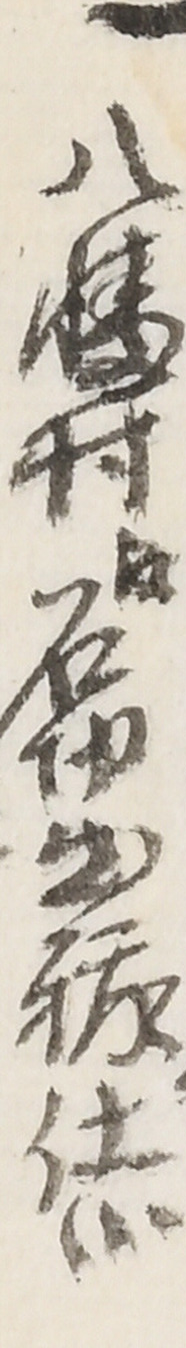一八幡村ニ石切出稼仕候
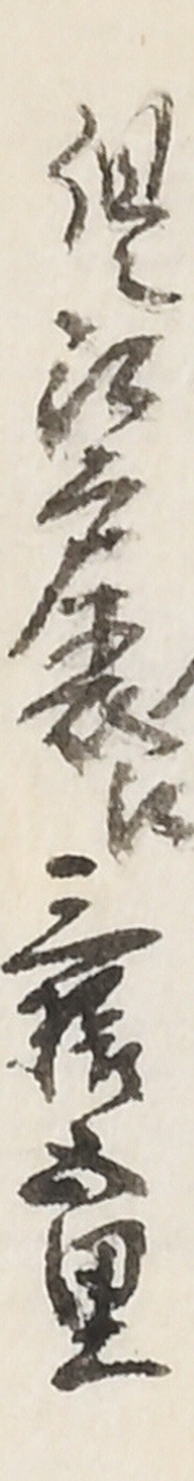但し江戸表え三拾五里
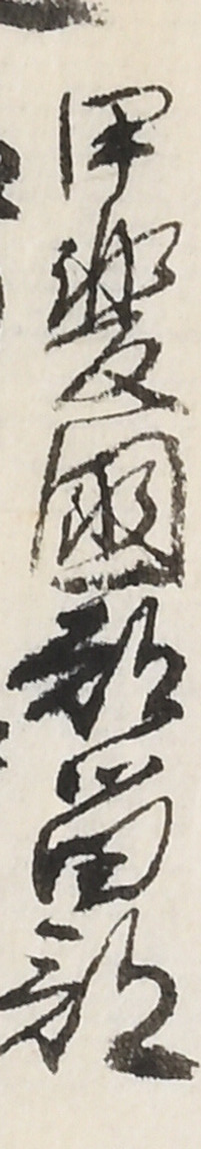甲斐国都留郡
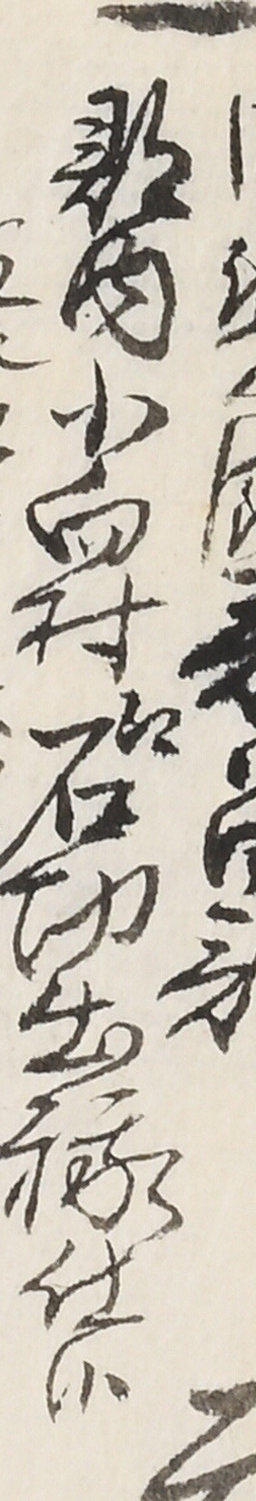一郡内小向村え石切出稼仕候
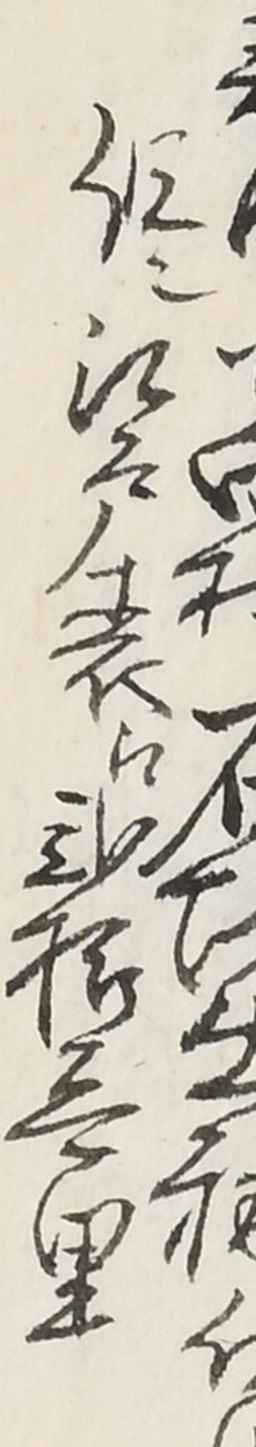但し江戸表え弐拾壱里
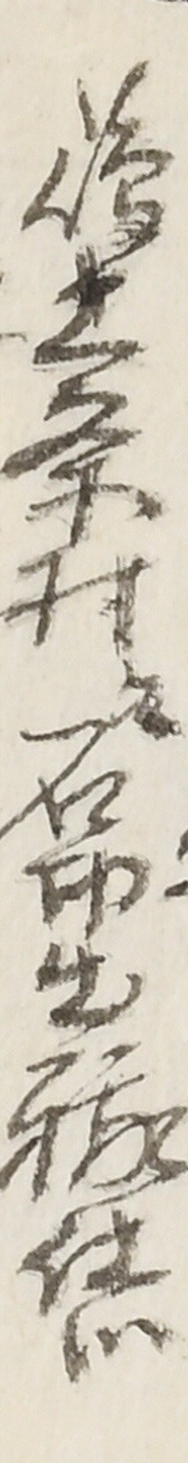一八幡村ニ石切出稼仕候
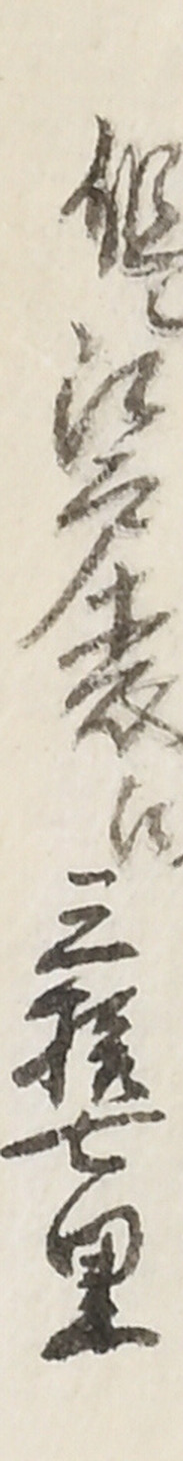但し江戸表え三拾七里
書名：嘉永五壬子年正月江戸近國石切出稼名前書上帳
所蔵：伊那市立高遠町図書館・合同会社AMANE
